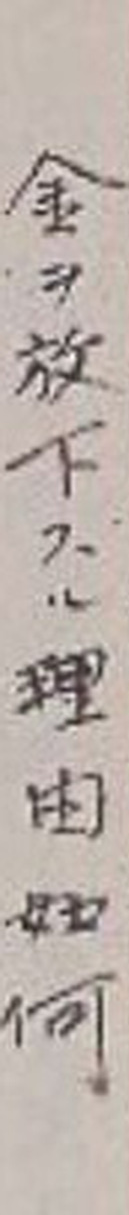金ヲ放下スル理由如何
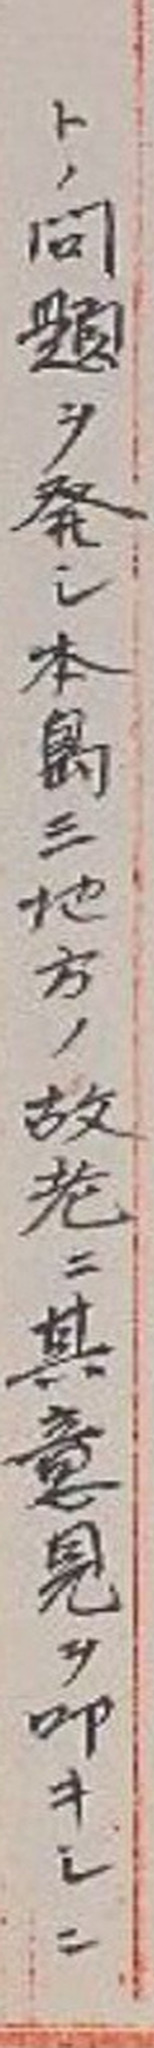トノ問題ヲ発シ本島三地方ノ故老ニ其意見ヲ叩キシニ
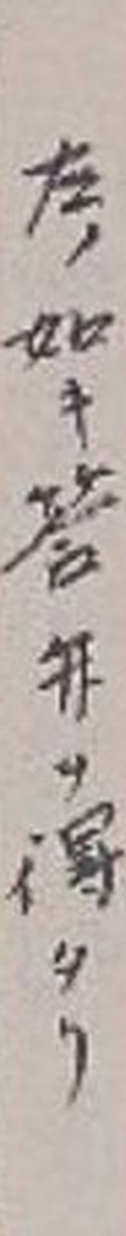左ノ如キ答弁ヲ得タリ

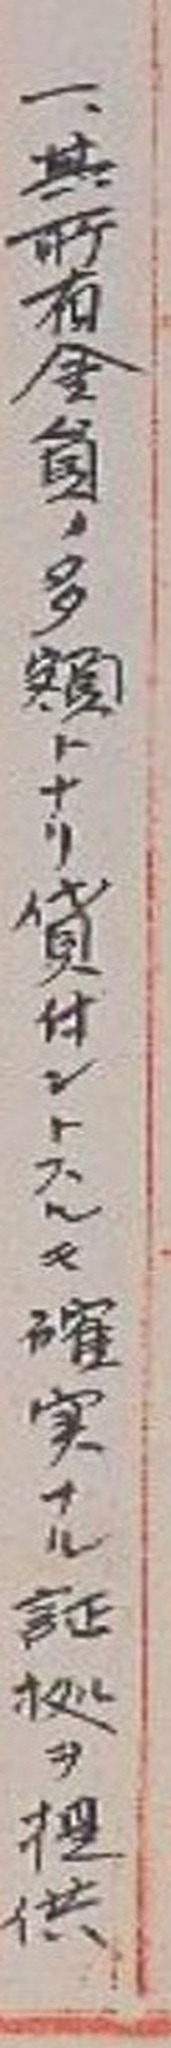一、其所有金員ノ多額トナリ貸付ントスルモ確実ナル証拠ヲ提供
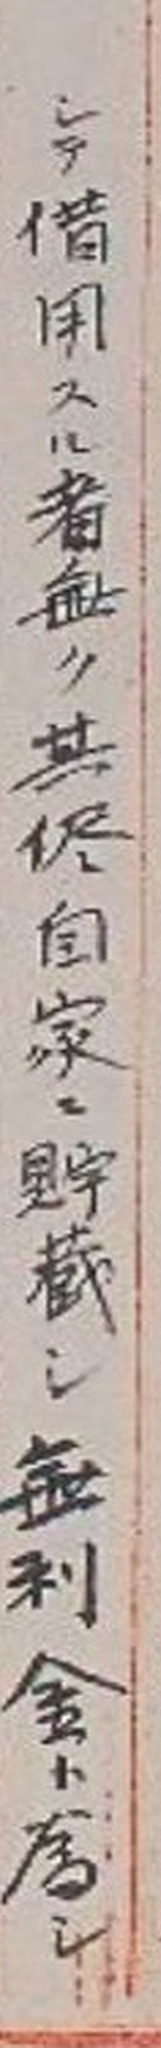シテ借用スル者無ク其儘自家ニ貯蔵シ無利金ト為シ
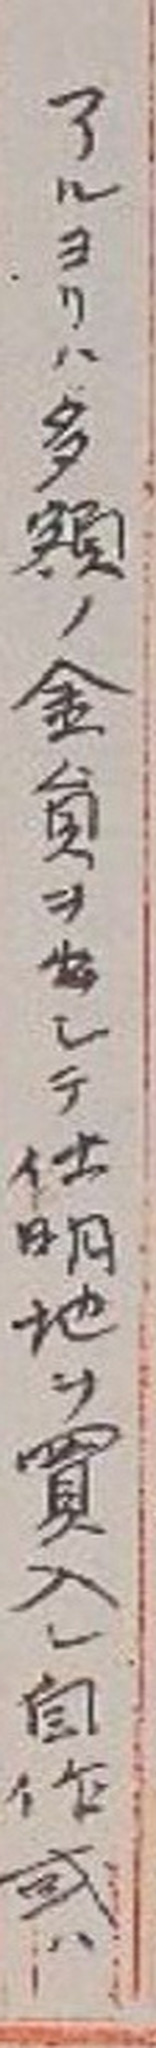アルヨリハ多額ノ金員ヲ出シテ仕明地ヲ買入レ自作或ハ
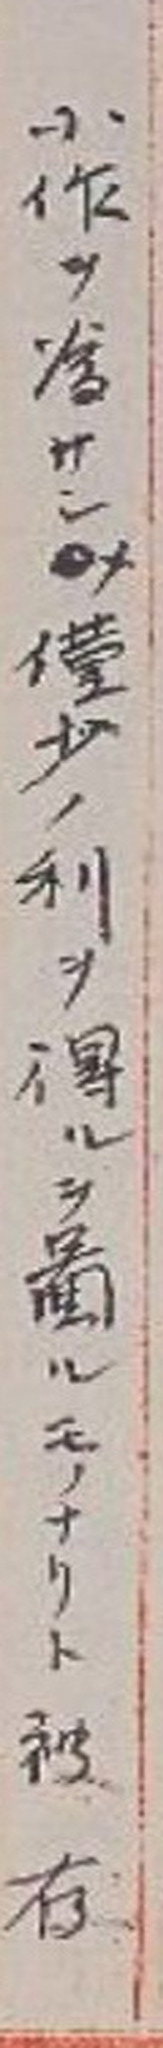小作ヲ為サシメ僅少ノ利ヲ得ルヲ図ルモノナリト被存
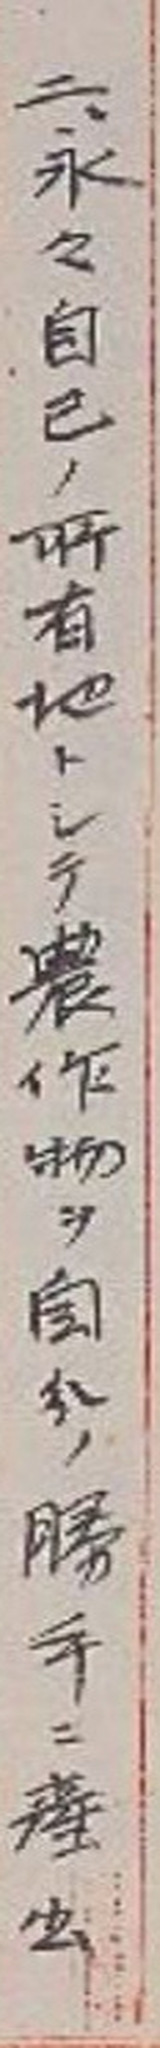二、永々自己ノ所有地トシテ農作物ヲ自分ノ勝手ニ産出
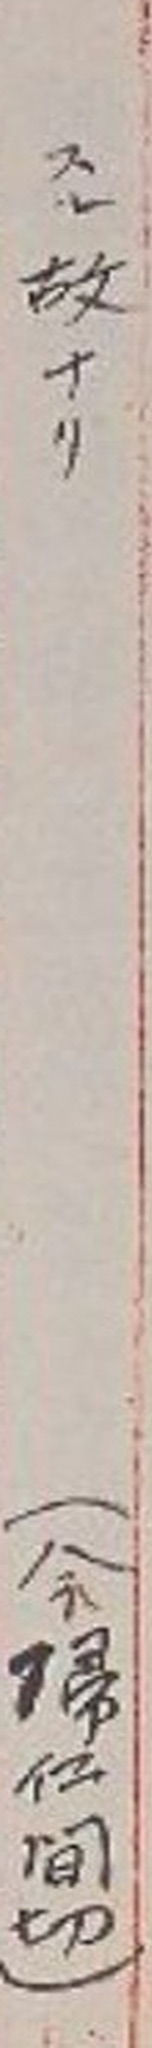スル故ナリ(今帰仁間切)
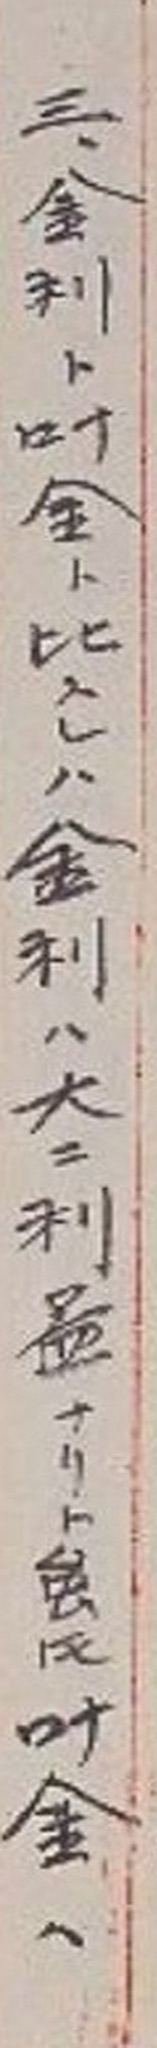三、金利ト叶金ト比スレハ金利ハ大ニ利益ナリト雖トモ叶金ハ
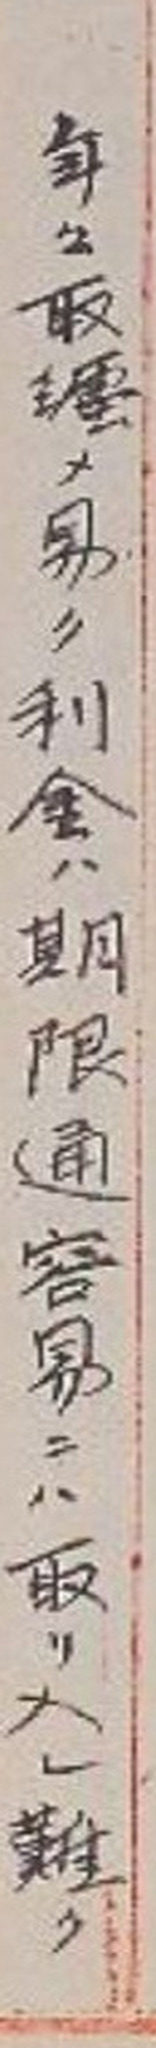年々取纏メ易ク利金ハ期限通容易ニハ取リ入レ難ク
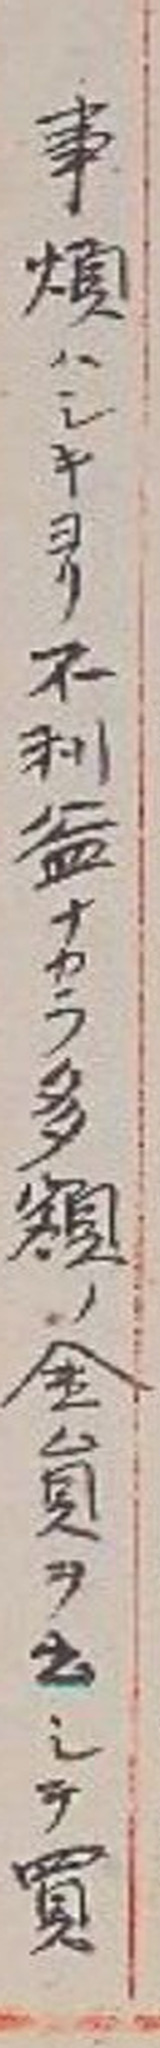事煩ハシキヨリ不利益ナカラ多額ノ金員ヲ出シテ買
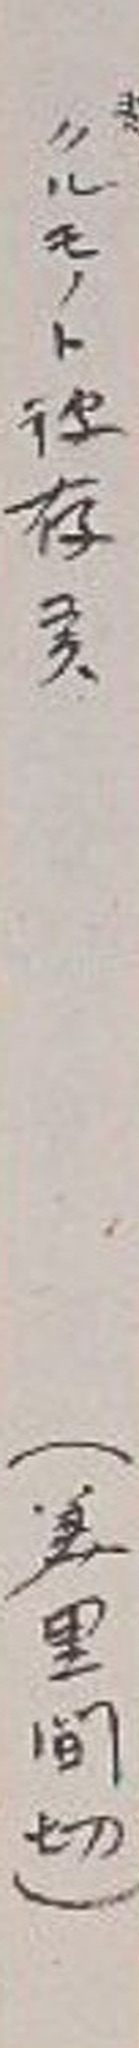クルモノト被存候(美里間切)
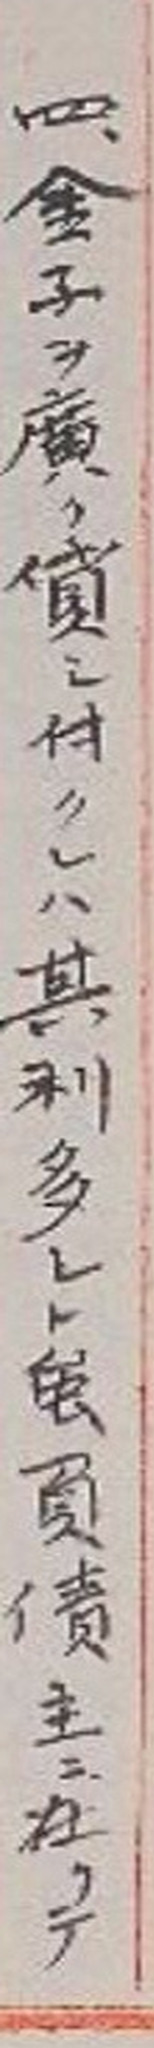四、金子ヲ広ク貸シ付クレハ其利多シト雖負債主ニ在リテ
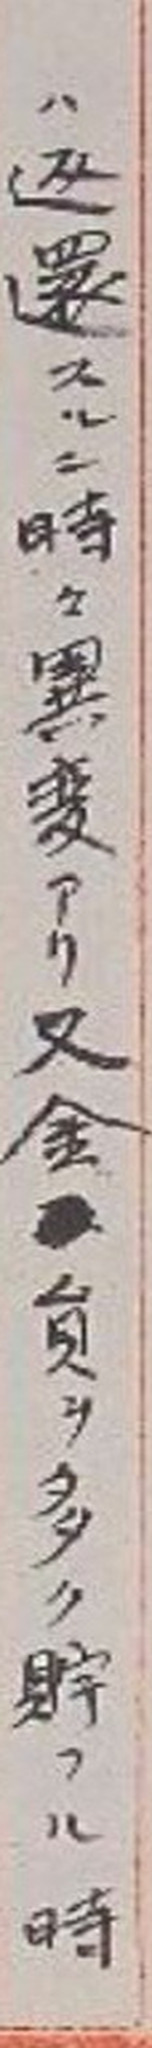ハ返還スルニ時々異変アリ又金員ヲ多ク貯フル時
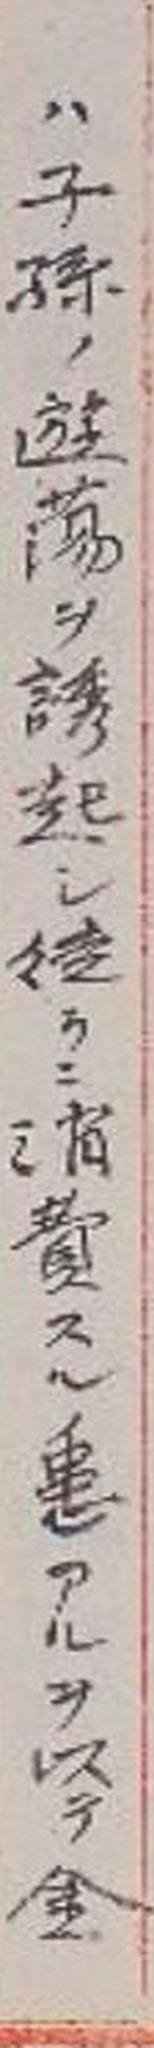ハ子孫ノ遊蕩ヲ誘起シ徒ラニ消費スルノ患アルヲ以テ金
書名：本県地価ノ高キ理由調書
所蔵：University of the Ryukyus Library
